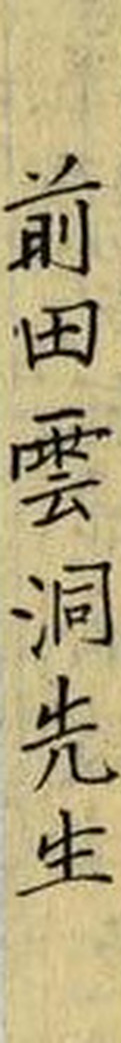前田雲洞先生
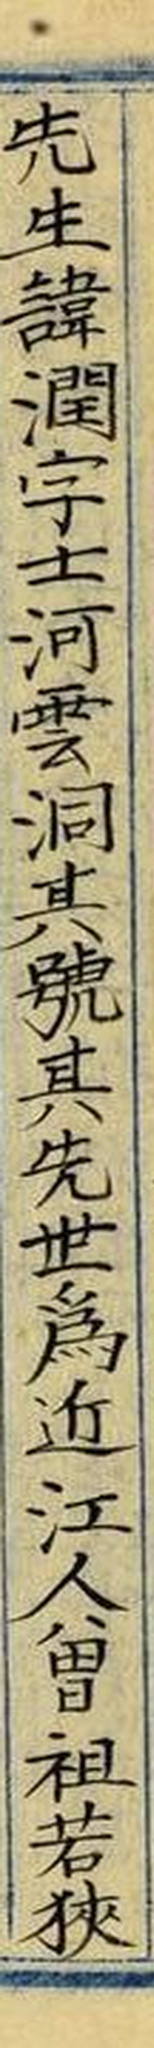先生諱潤字士河雲洞其號其先世爲近江人曽祖若狹
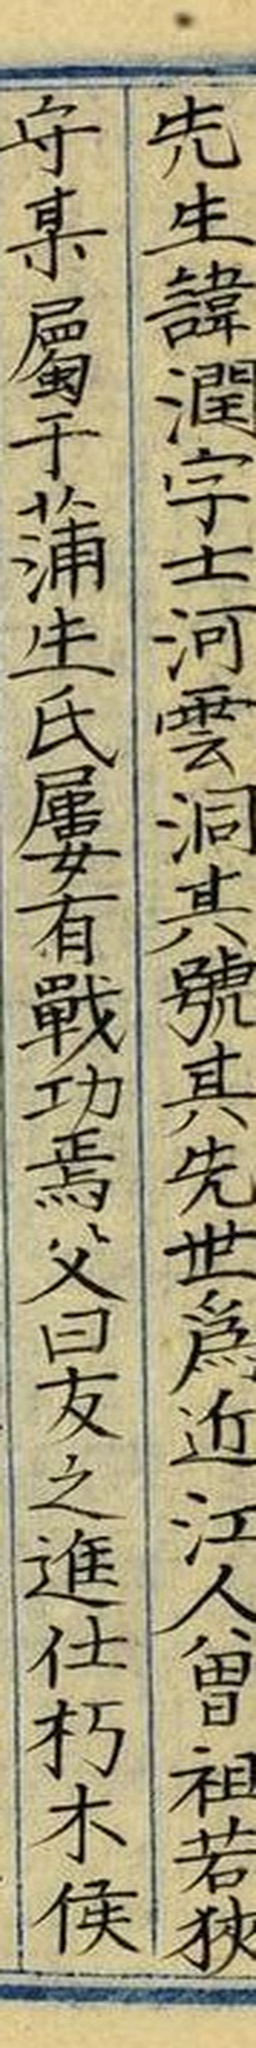守某屬于蒲生氏屢有戰功焉父曰友之進仕朽木侯
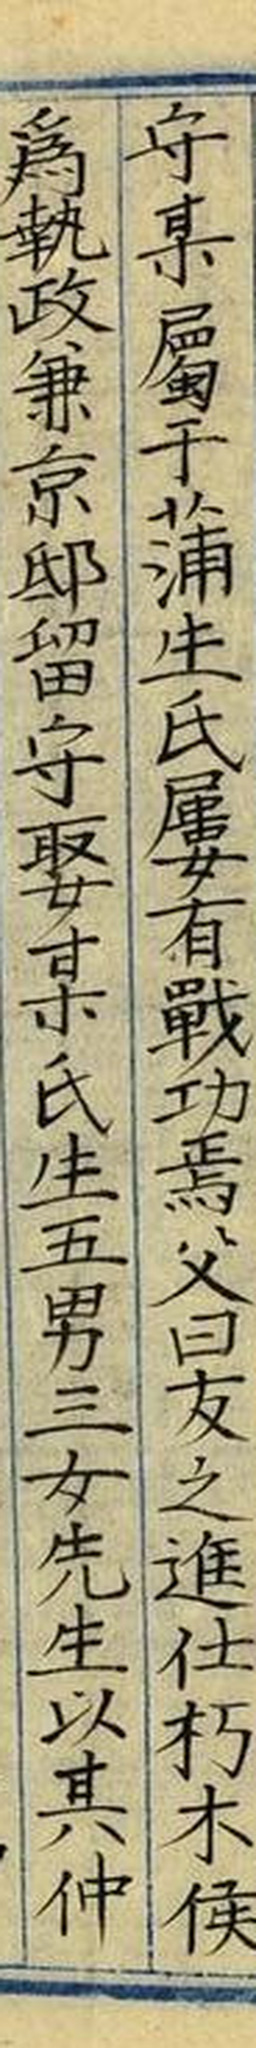爲執政兼京邸留守娶某氏生五男三女先生以其仲
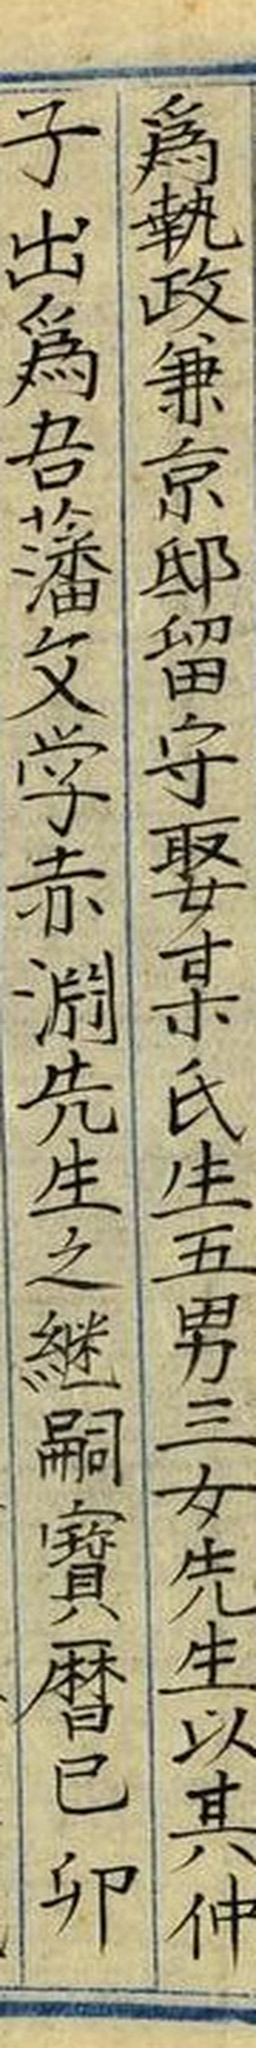子出爲吾藩文学赤淵先生之継嗣寶暦己卯
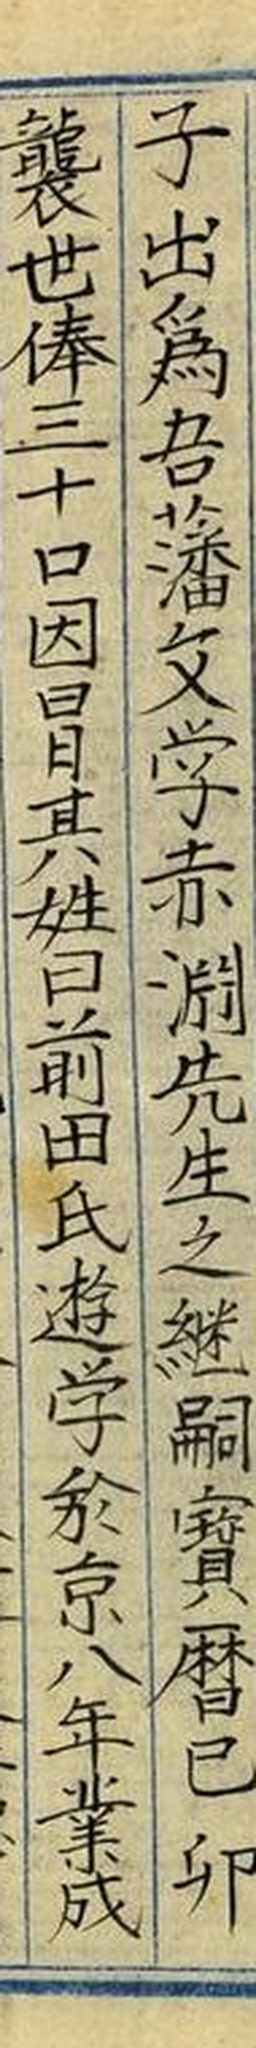襲世俸三十口因冐其姓曰前田氏逰学於京八年業成
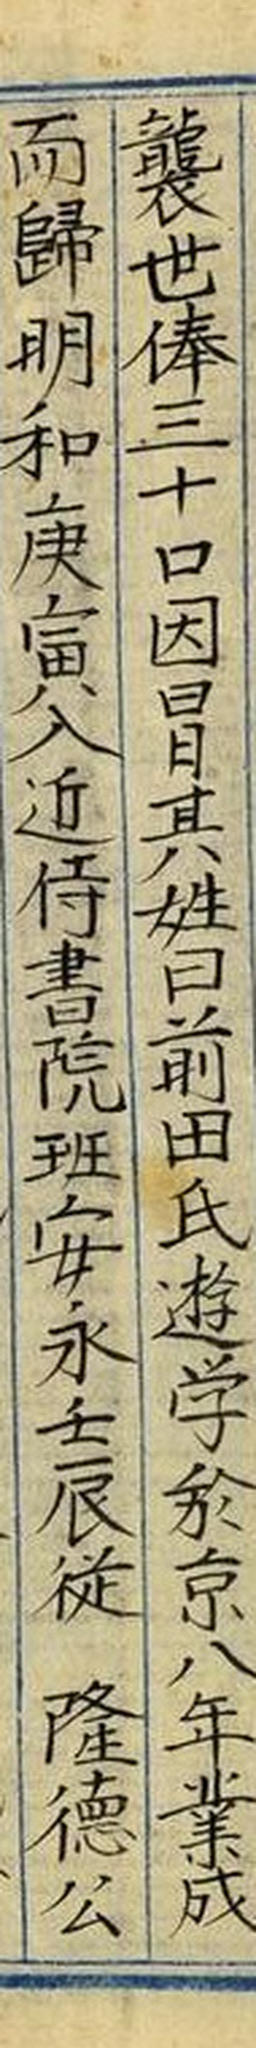而歸明和庚寅入近侍書院班安永壬𫝕従隆德公
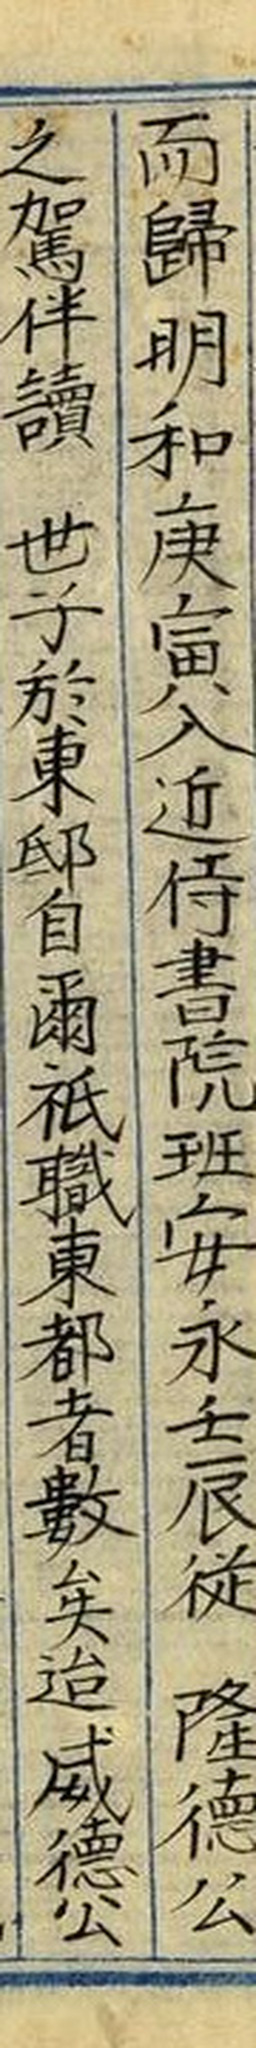之駕伴讀世子於東邸自爾祇職東都者數矣迨威德公
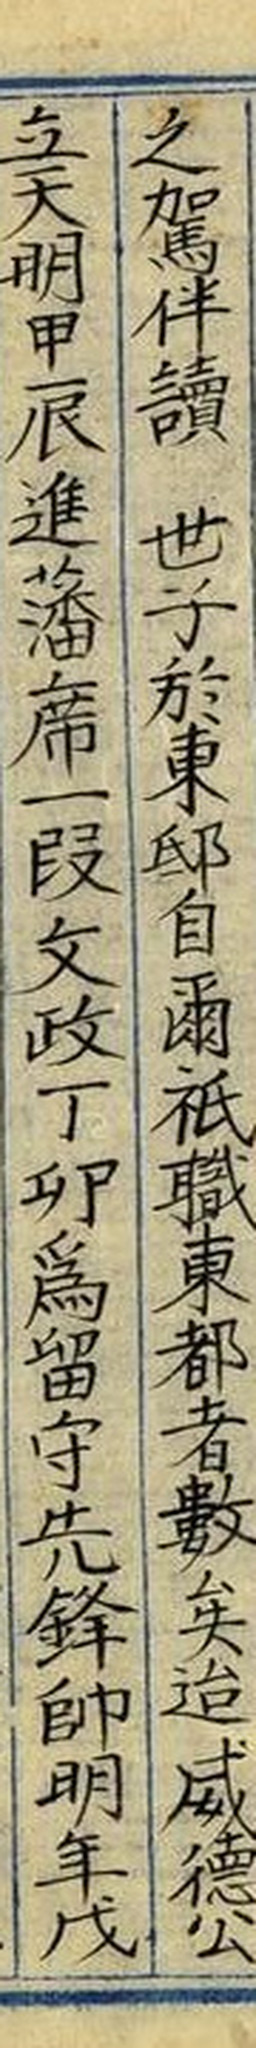立天明甲𫝕進藩席一叚文政丁卯爲留守先鋒帥明年戊
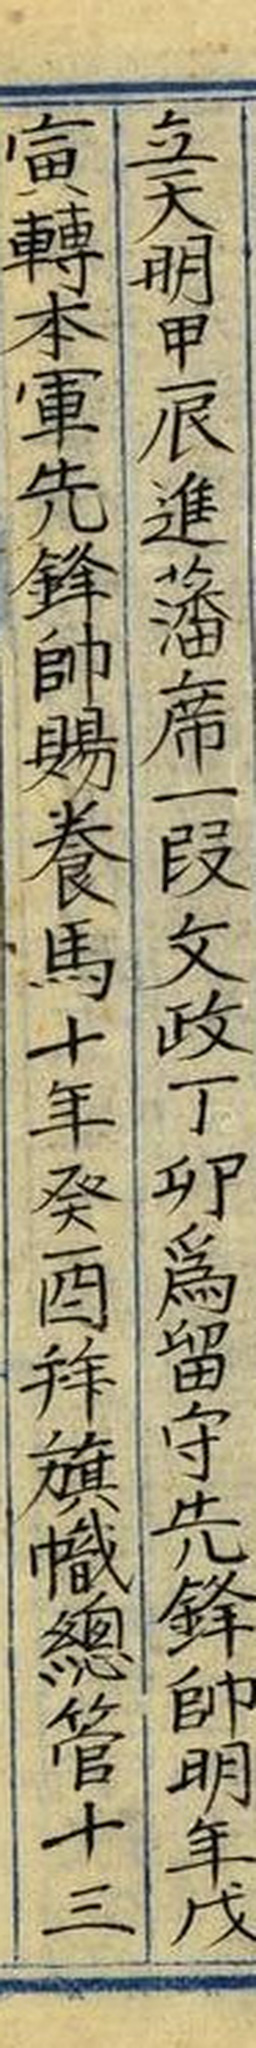寅轉本軍先鋒帥賜餋馬十年癸酉拜旗幟總管十三

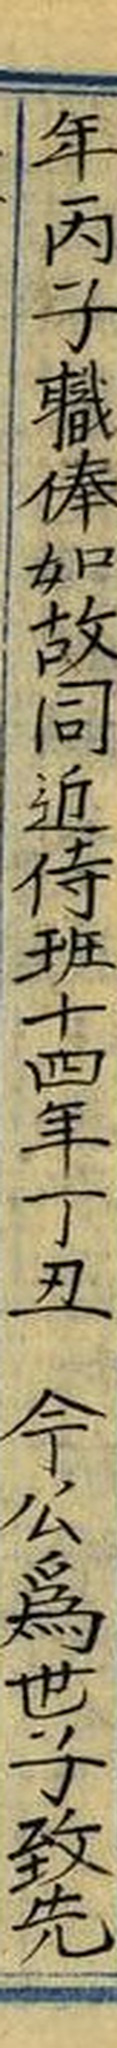年丙子職俸如故同近侍班十四年丁丑今公爲世子致先
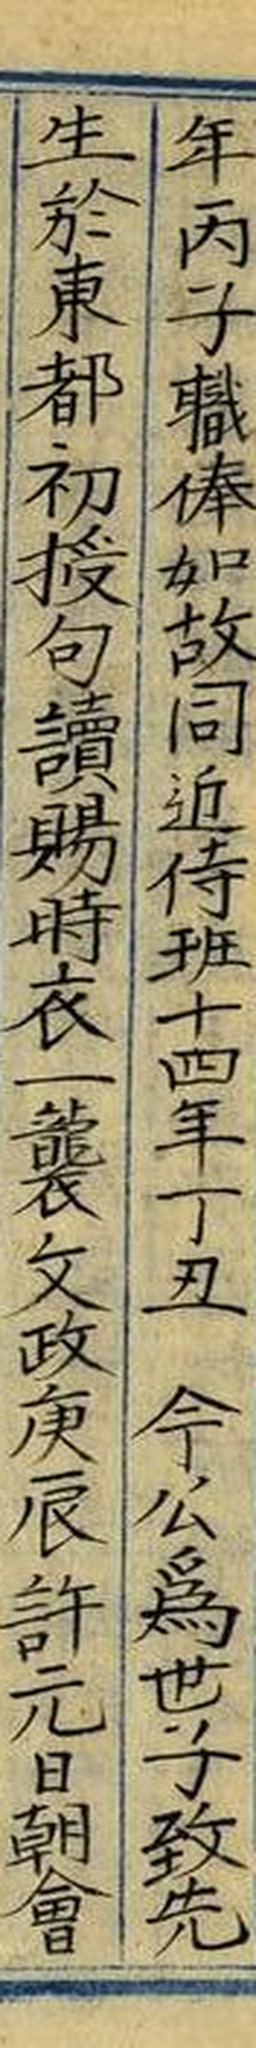生於東都初授句讀賜時衣一襲文政庚𫝕許元日朝會
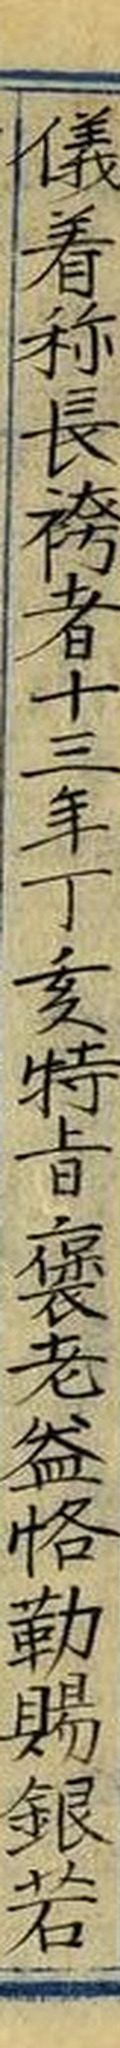儀着称長袴者十三年丁亥特㫖褒老益恪勒賜銀若
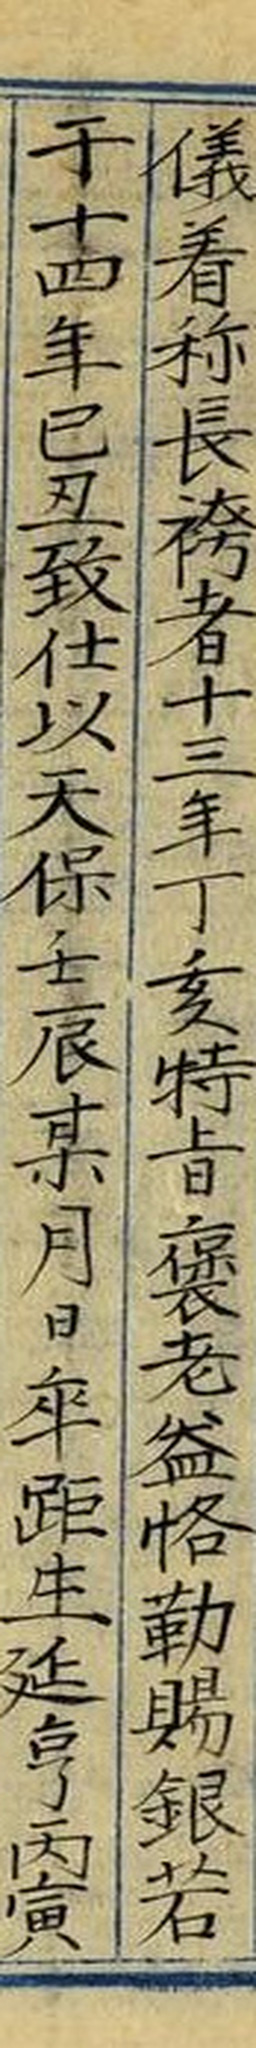干十四年己丑致仕以天保壬𫝕某月日卒距生延享丙寅
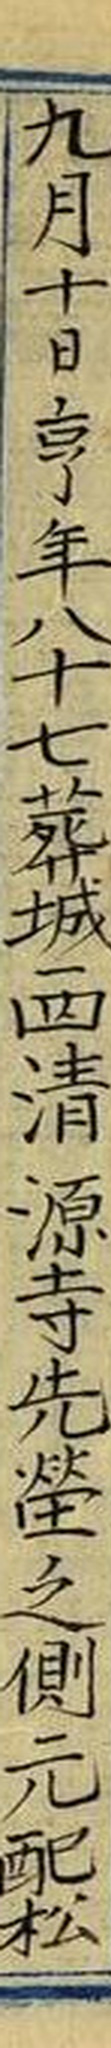九月十日享年八十七葬城西清源寺先塋之側元配松
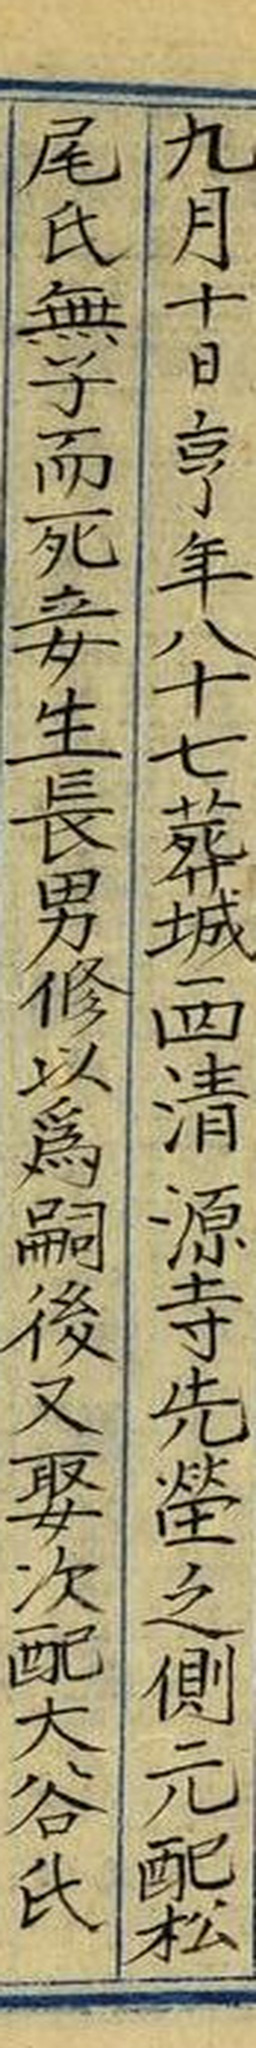尾氏無子而死妾生長男修以爲嗣後又娶次配大谷氏
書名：温古集 四巻
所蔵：福井県文書館 Fukui Prefectural Archives
